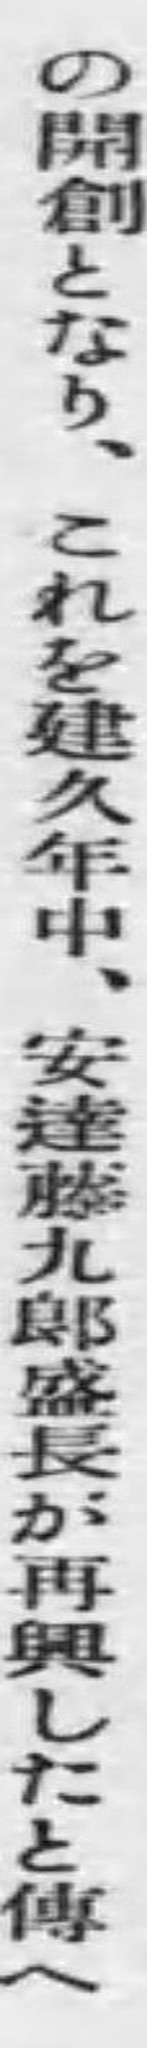の開創となり、これを建久年中、安達藤九郎盛長が再興したと伝へ
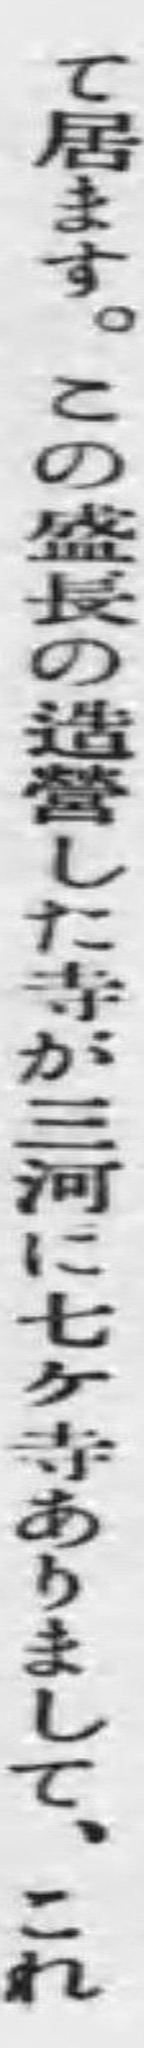て居ます。この盛長の造営した寺が三河に七ヶ寺ありまして、これ
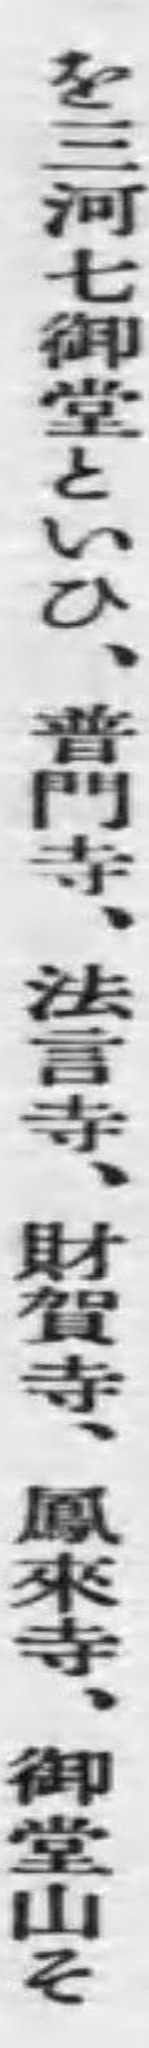を三河七御堂といひ、普門寺、法言寺、財賀寺、鳳来寺、御堂山そ
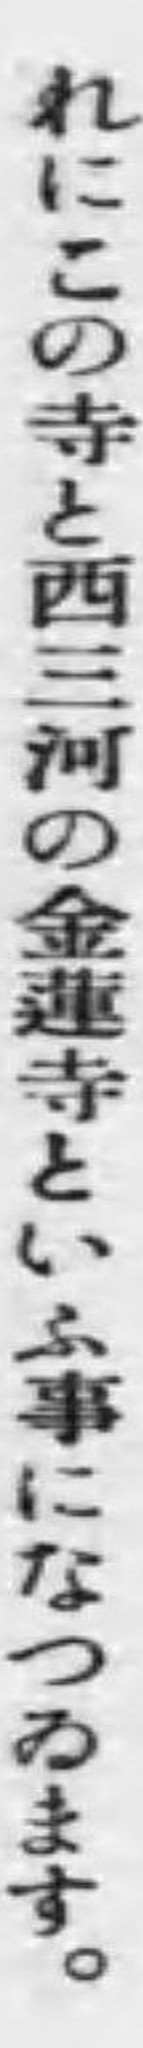れにこの寺と西三河の金蓮寺といふ事になつゐます。
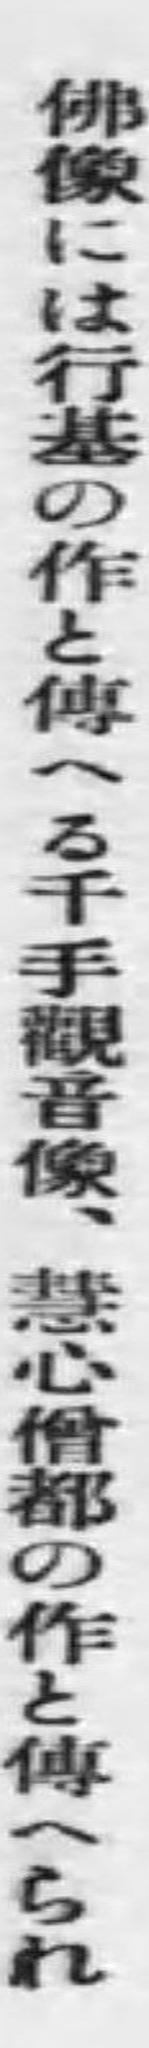仏像には行基の作と伝へる千手観音像、慧心僧都の作と伝へられ
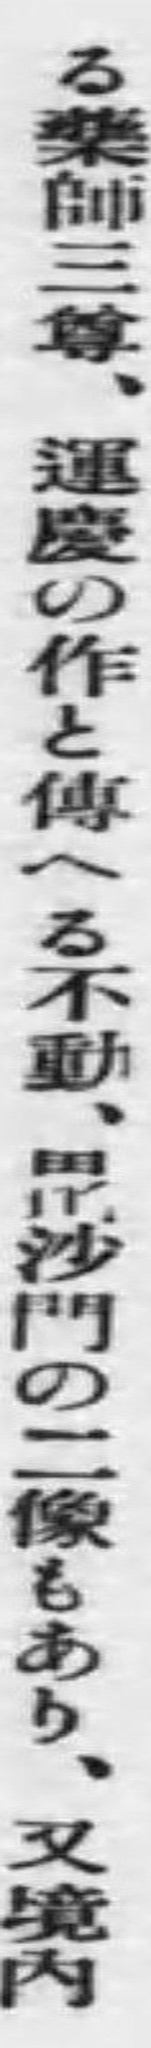る薬師三尊、運慶の作と伝へる不動、毘沙門の二像もあり、又境内
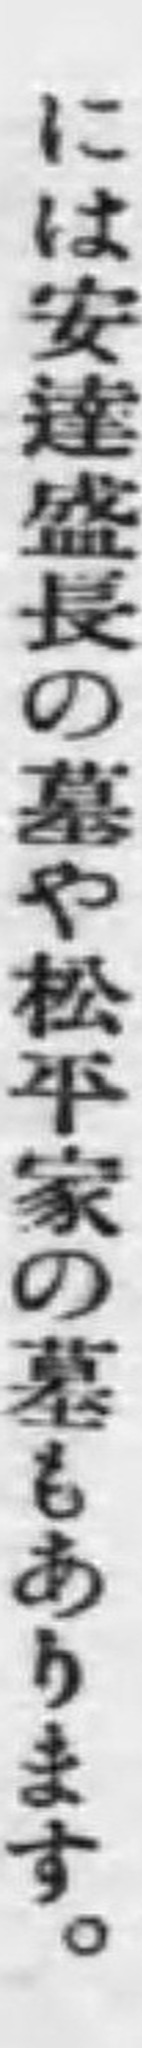には安達盛長の墓や松平家の墓もあります。
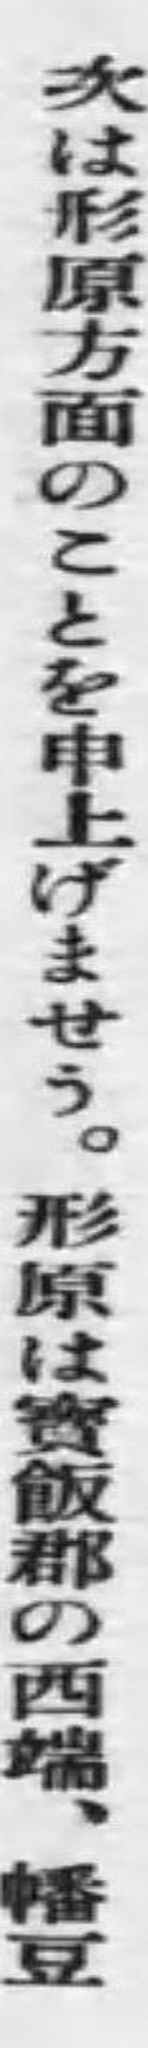次は形原方面のことを申上げませう。形原は宝飯郡の西端、幡豆
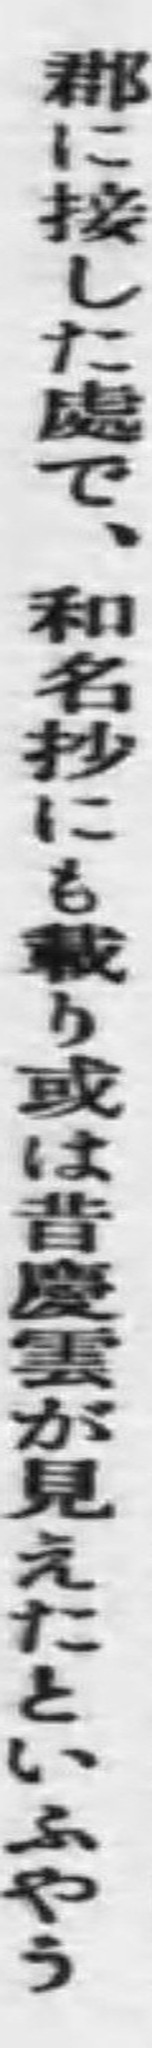郡に接した処で、和名抄にも載り或は昔慶雲が見えたといふやう
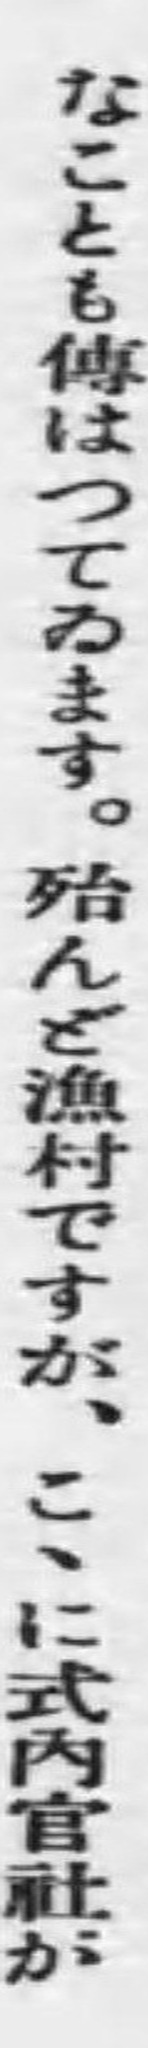なことも伝はつてゐます。殆んど漁村ですが、こゝに式内官社が
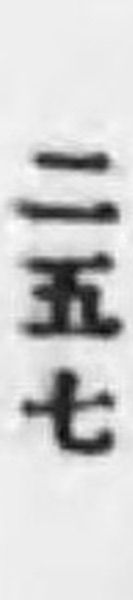二五七

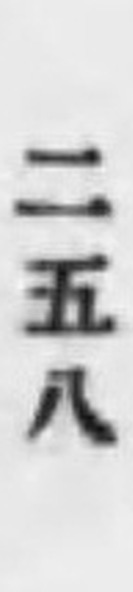二五八
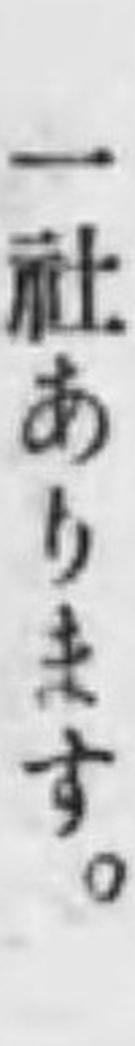一社あります。
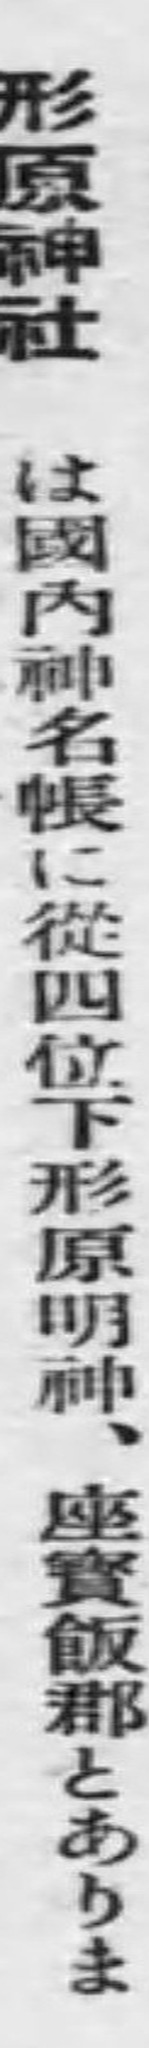形原神社は国内神名帳に従四位下形原明神、座宝飯郡とありま
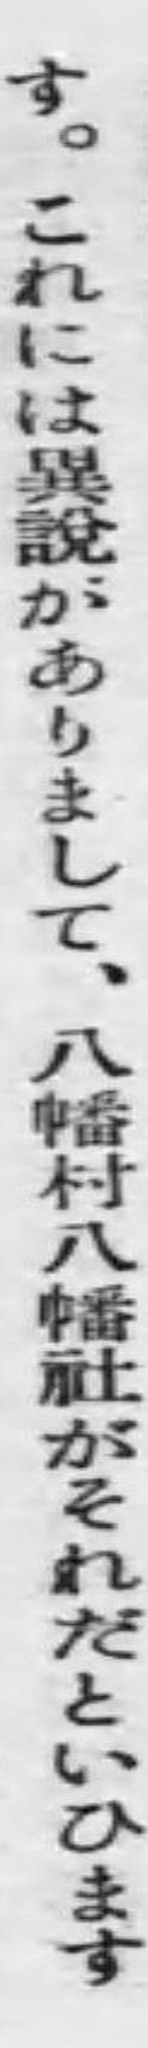す。これには異説がありまして、八幡村八幡社がそれだといひます
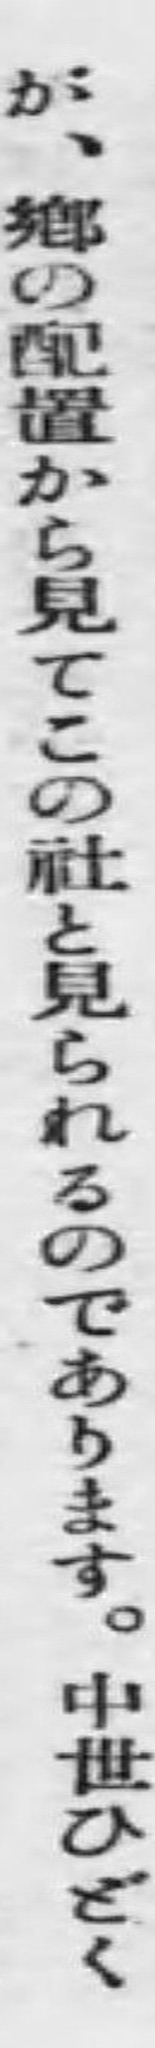が、郷の配置から見てこの社と見られるのであります。中世ひどく
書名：東三河道中記 : 豊橋市及其附近案内
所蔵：国立国会図書館 National Diet Library, JAPAN
